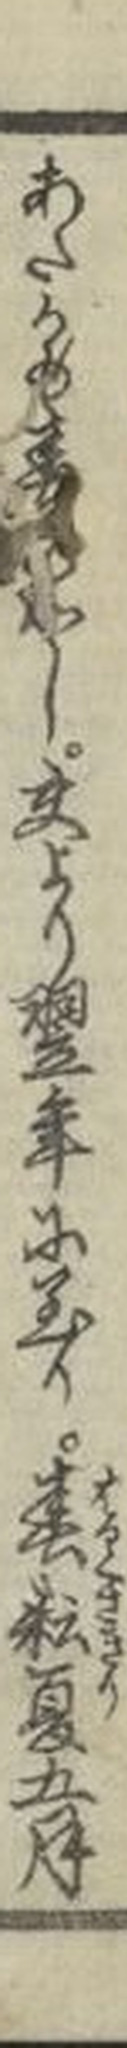あたかも春の如し。夫より翌年に至り。春耘夏五月
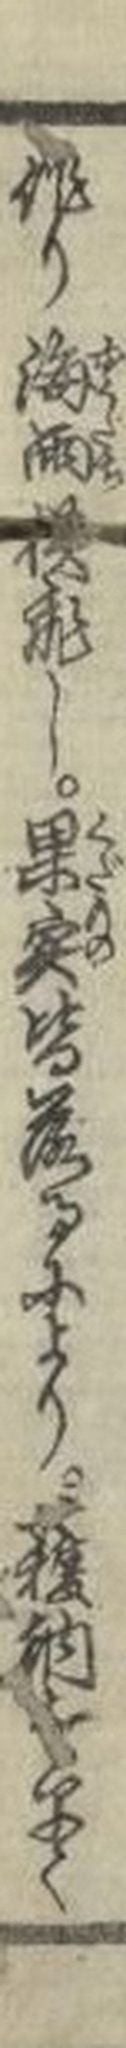作り海雨飛し。果実皆落るにより。穫納早く

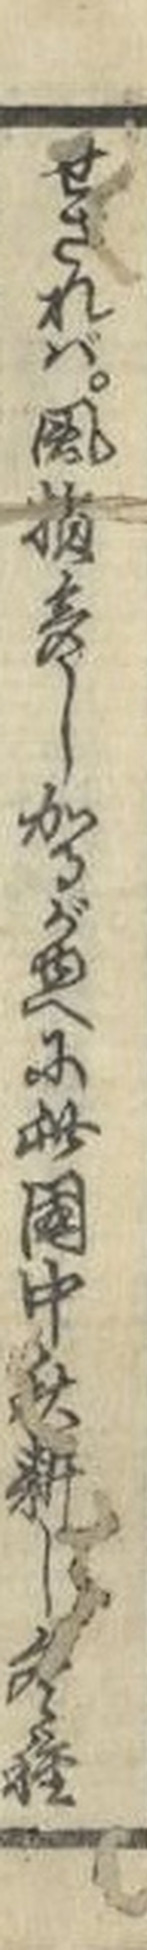せされば。風損多しかるがゆへに此国中秋耕し冬種
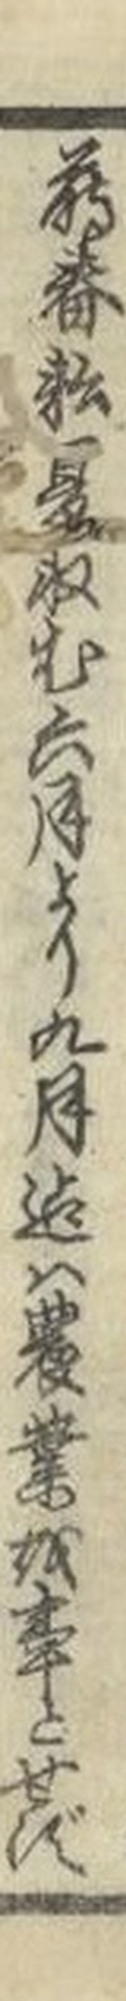蒔春耘夏収む六月より九月迄は農業を事とせず
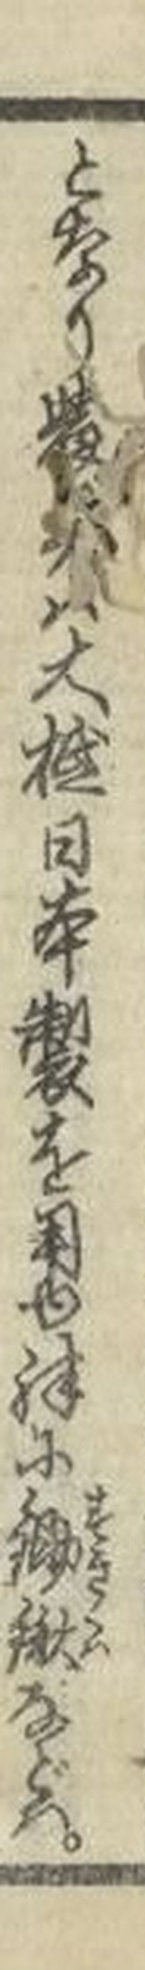となり農具は大抵日本製を用ゆ殊に鋤鍬などは。
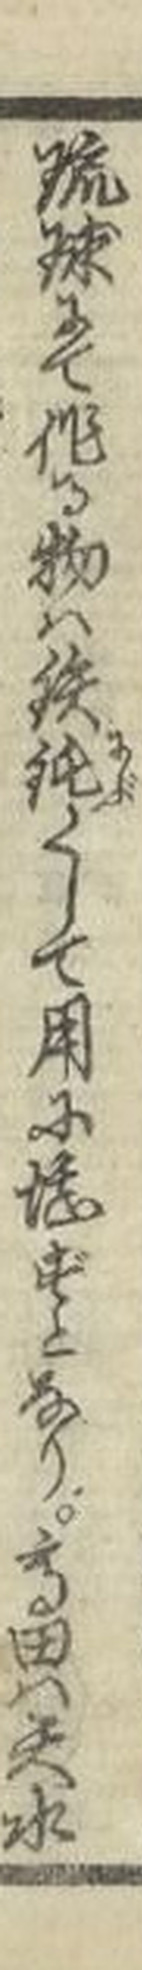琉球にて作る物は鉄鈍くして用に堪ずとなり。高田は天水
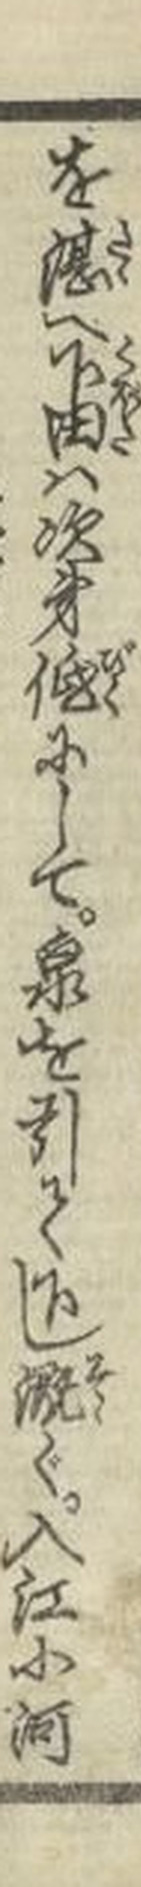を湛へ下田は次第低にして。泉を引て下し漑ぐ。入江小河
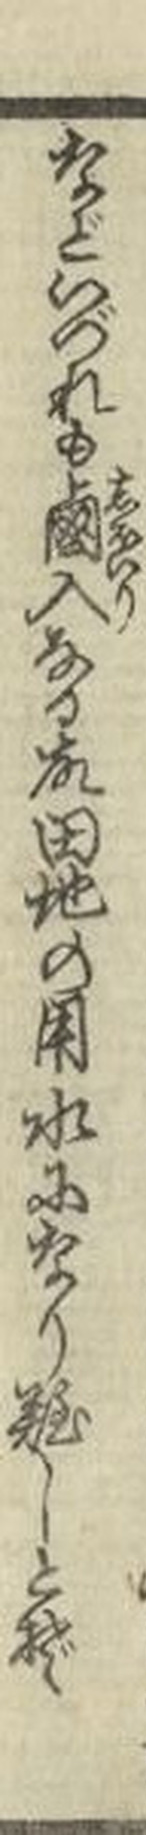などいづれも鹵入なる故田地の用水になり難しとぞ
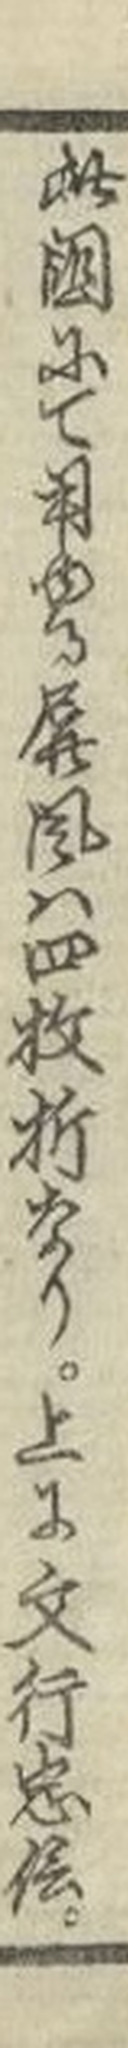此国にて用ゆる屏風は四枚折なり。上に文行忠信。
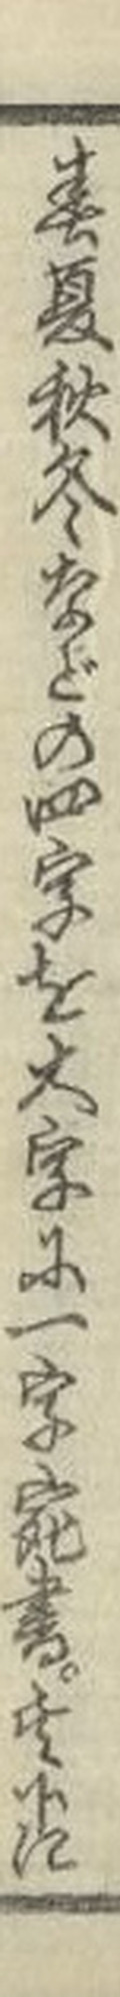春夏秋冬などの四字を大字に一字宛書。其下に
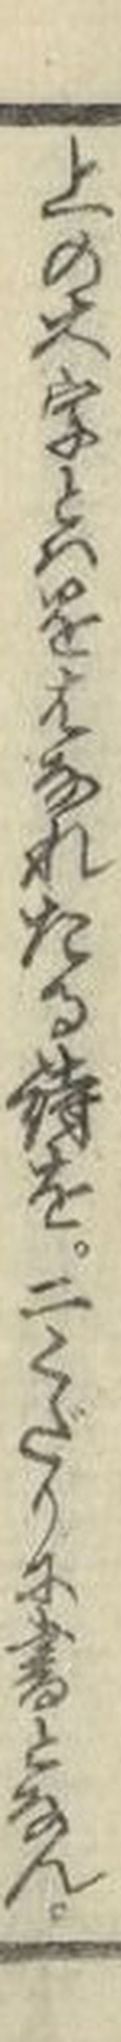上の大字とは懸はなれたる詩を。二くだりに書となん。
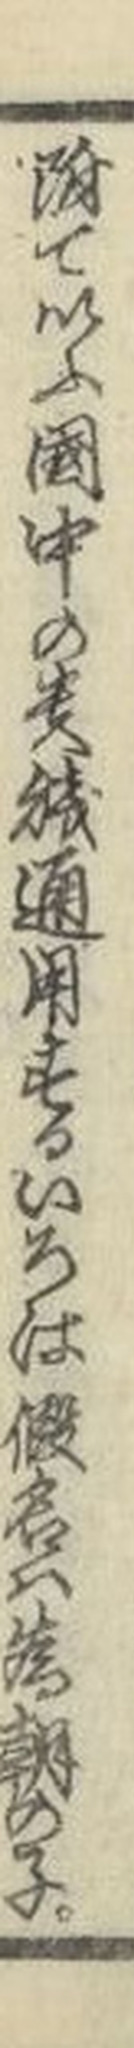附ていふ国中の貴賤通用するいろは仮名は為朝の子。
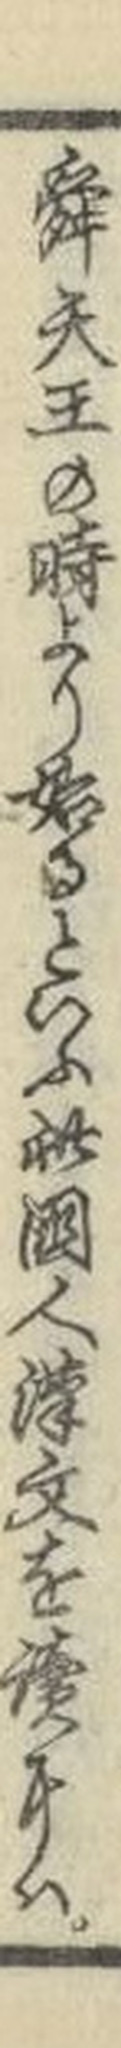舜天王の時より始るといふ此国人漢文を読には。
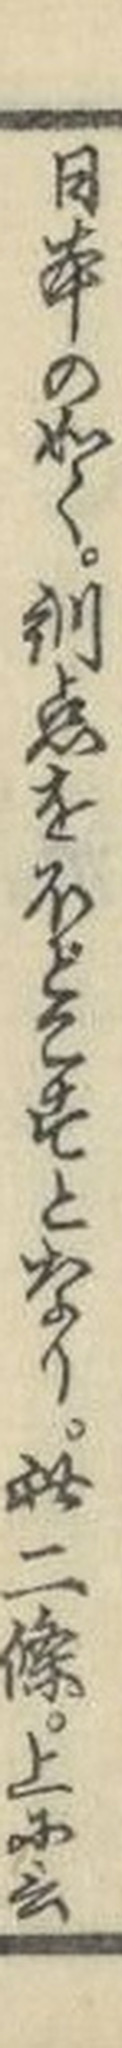日本の如く。訓点をほどこすとなり。此二条。上に言
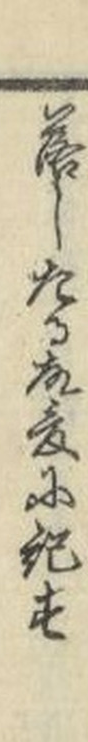落したる故爰に紀す
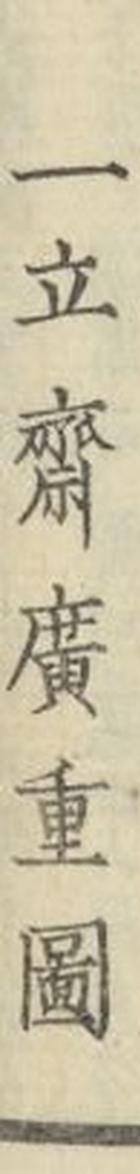同一立齋広重図
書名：琉球解語
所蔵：University of the Ryukyus Library
